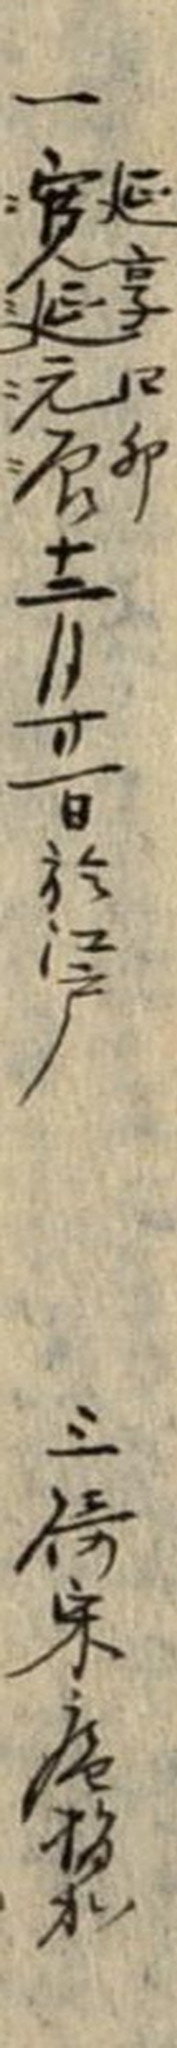一寛延元辰十二月廿一日於江戸三崎宗庵指加
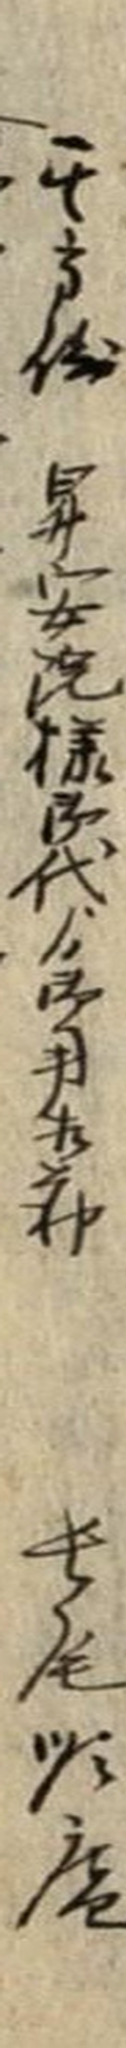其方儀昇安院様御代ゟ御用相勤長尾順庵
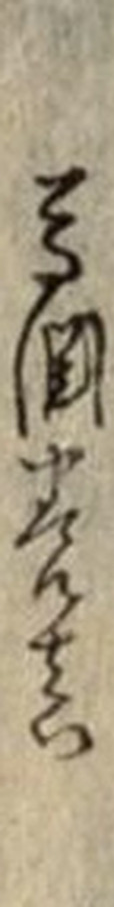馬淵養真
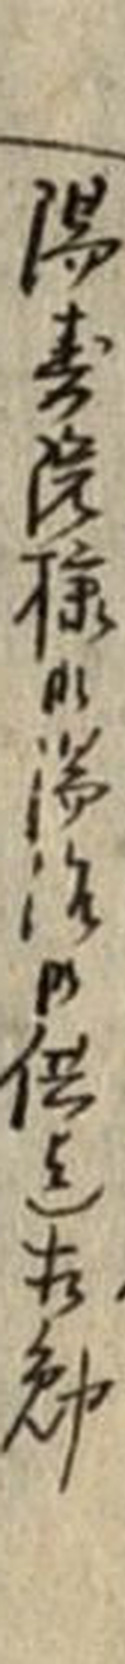陽寿院様御湯治御供迄相勤
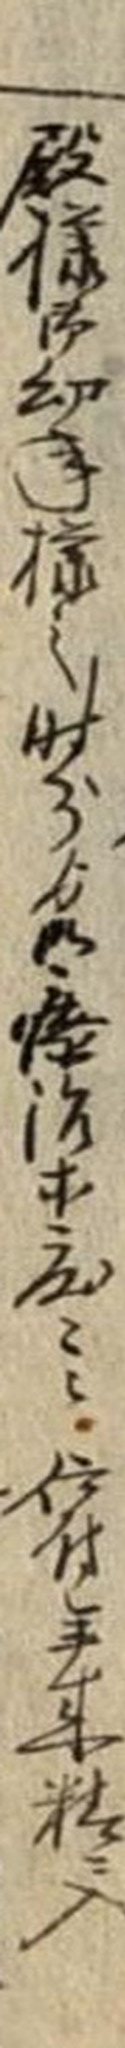殿様御幼年様之時分ゟ御療治等度々被仰付年来精に入
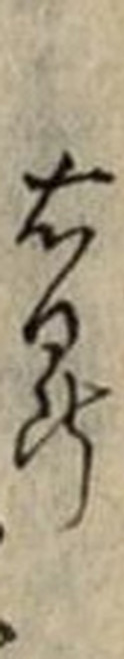右同断
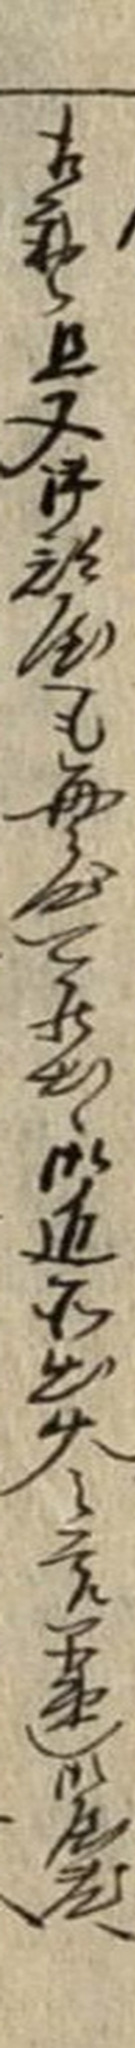相勤候且又御部屋へも毎度可罷出候御近所出火之節早速御屋敷へ
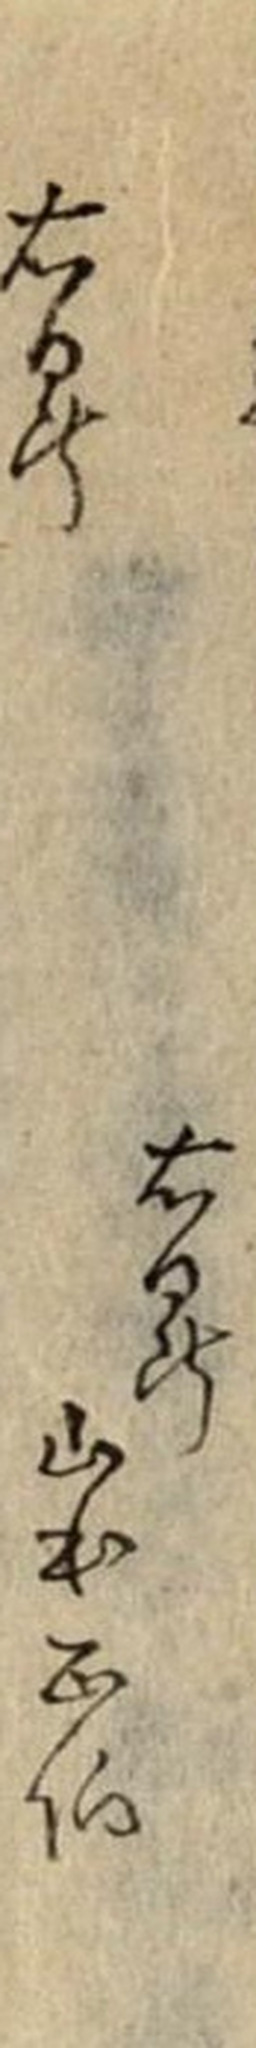右同断山本正伯
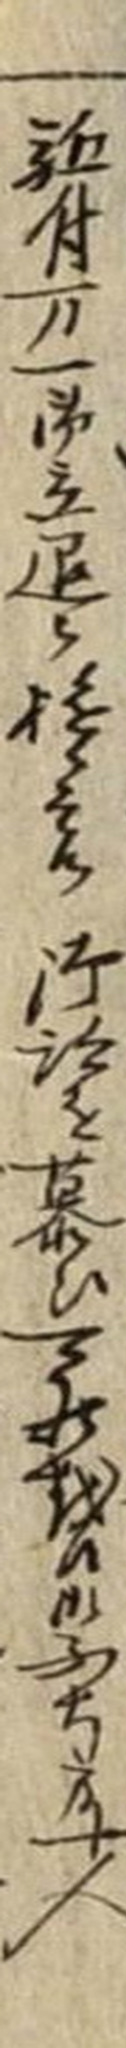駆付万一立退被遊候節御跡を慕ひ可罷越候御ふち方十人
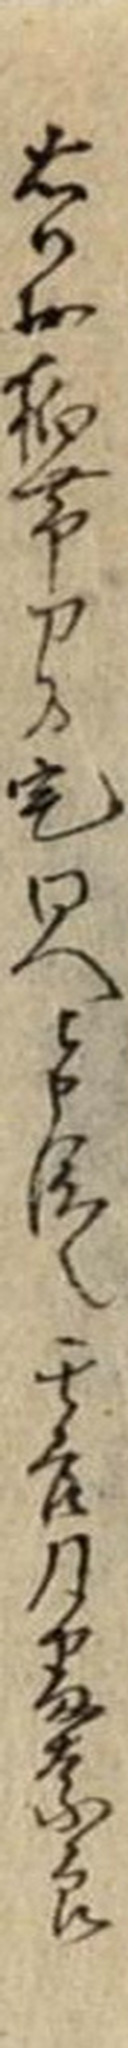右は於狛帯刀方宅同人被申渡之其節月番奈良
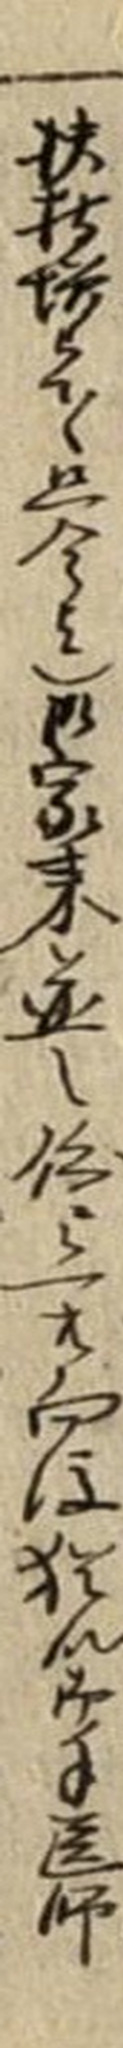扶持増被下之只今迄御家来並之儀に候へ共向後猶以御手医師
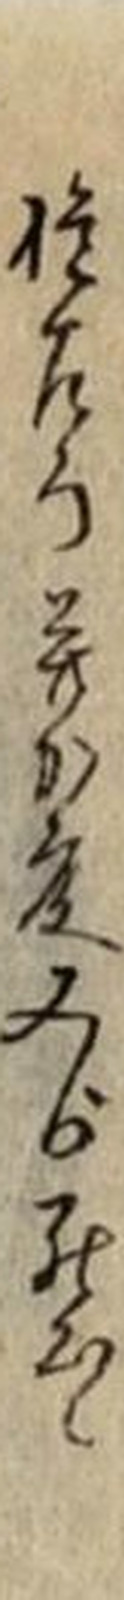権左衛門并加藤又右衛門罷出候
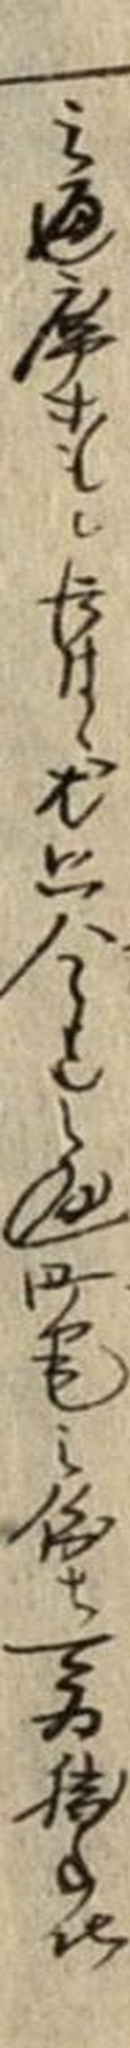之通席等も被仰付候尤只今迄之通町宅之儀は可為勝手次
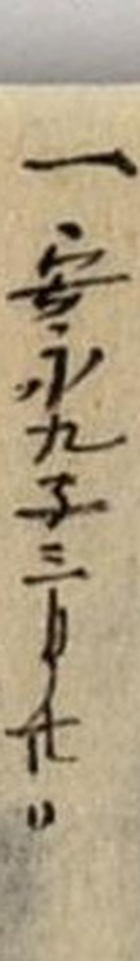一安永九子三月廿日
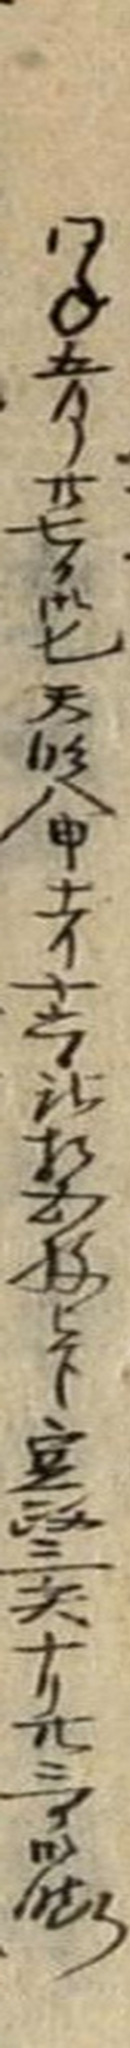同年五月廿七日御匙天明八申十一月十六日銀拾五枚被下寛政三亥十月廿三日御暇
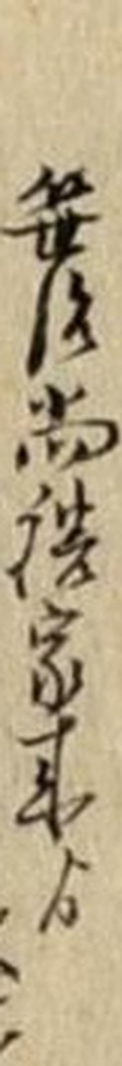笹治尚膳家来ゟ
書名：御用并被仰出之部
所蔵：福井県文書館 Fukui Prefectural Archives
